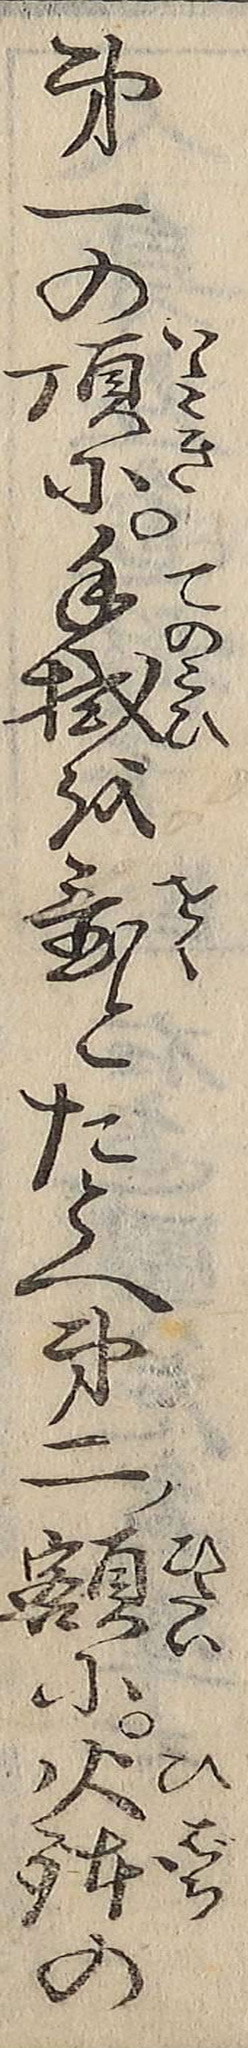第一の頂に。手拭を置とたとへ第二の額に。火鉢の
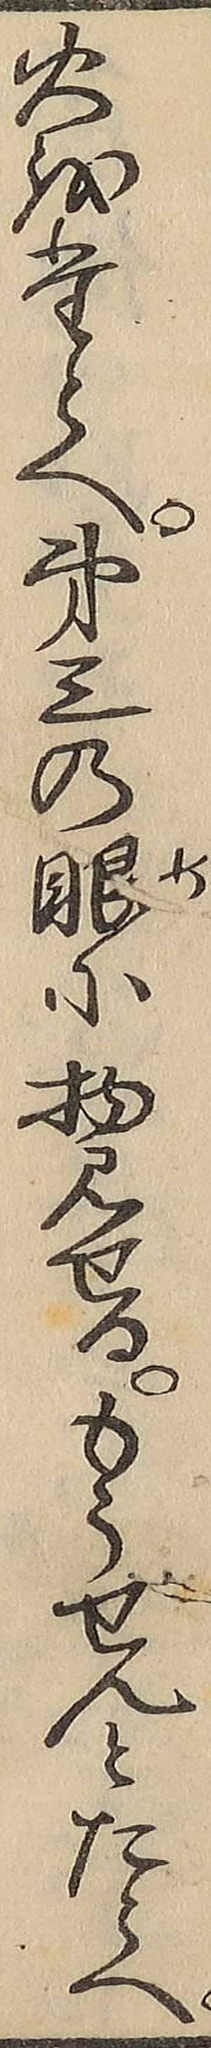火をたとへ。第三の眼に物見せる。もうせんとたとへ。
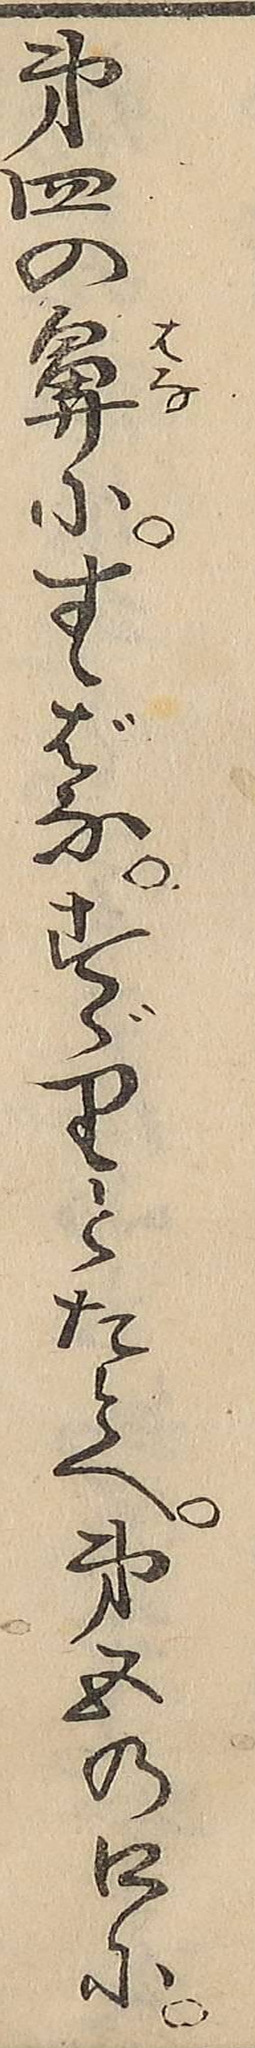第四の鼻に。すゝばな。すゞりとたとへ。第五の口に。
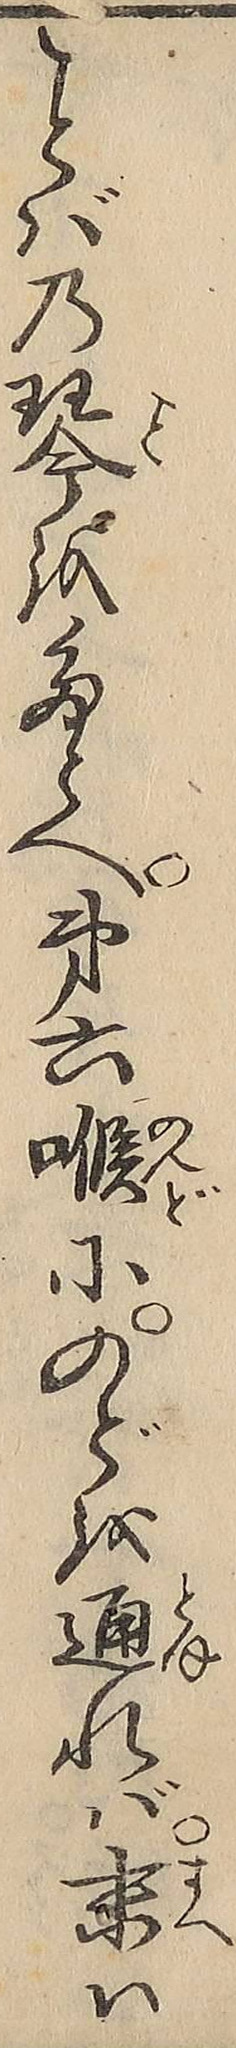ことばの琴をたとへ。第六喉に。のどを通れば。末は
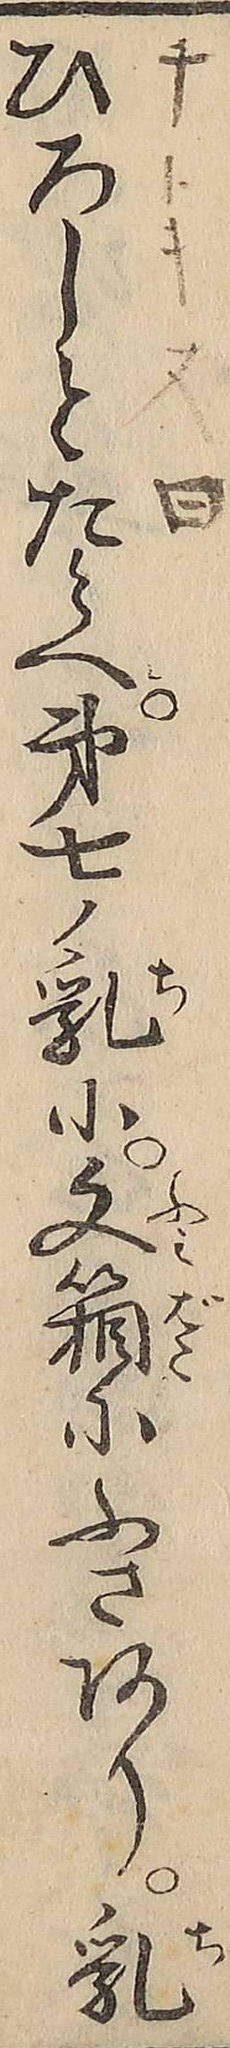ひろしとたとへ。第七の乳に。文箱にふさあり。乳
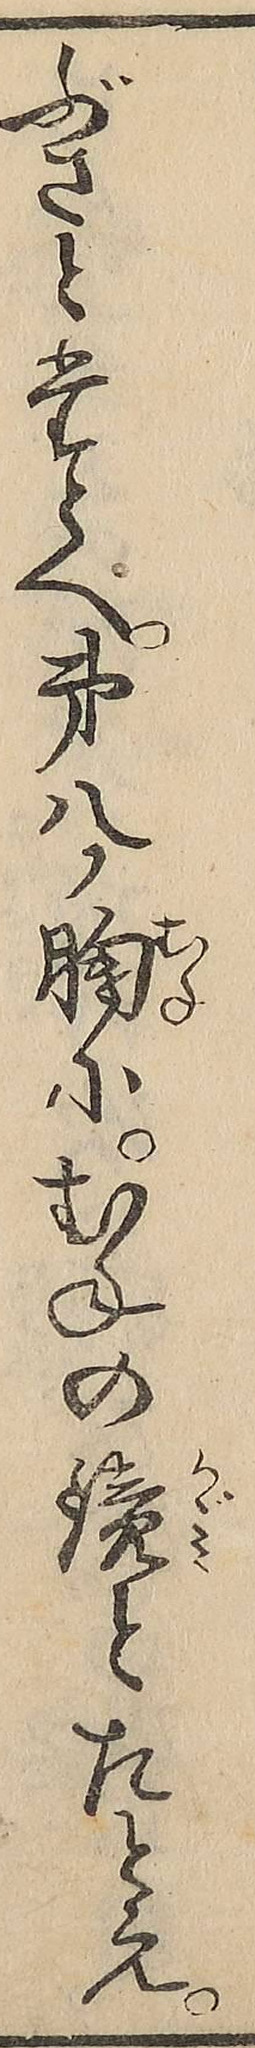ぶさとたとへ。第八の胸に。むねの鏡とたとえ。
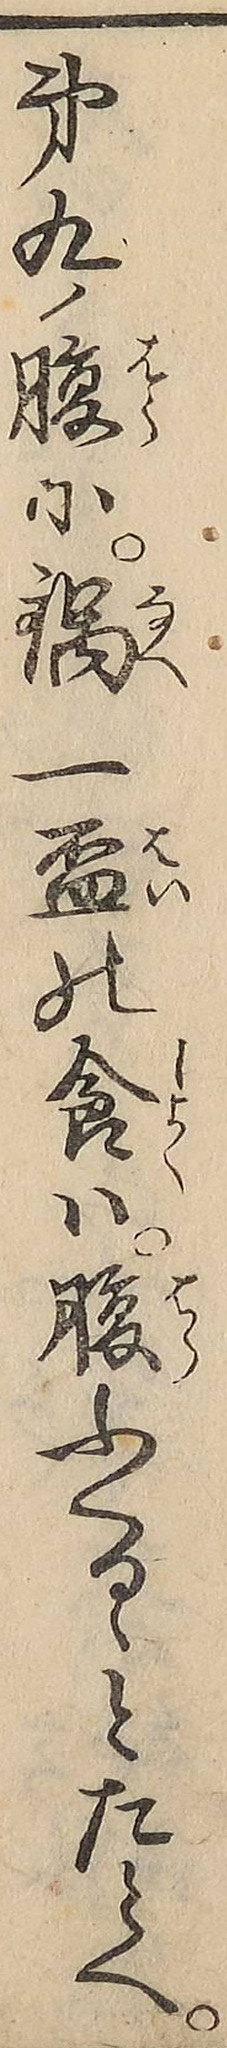第九の腹に。鍋一盃の食は。腹ふくるゝとたとへ。
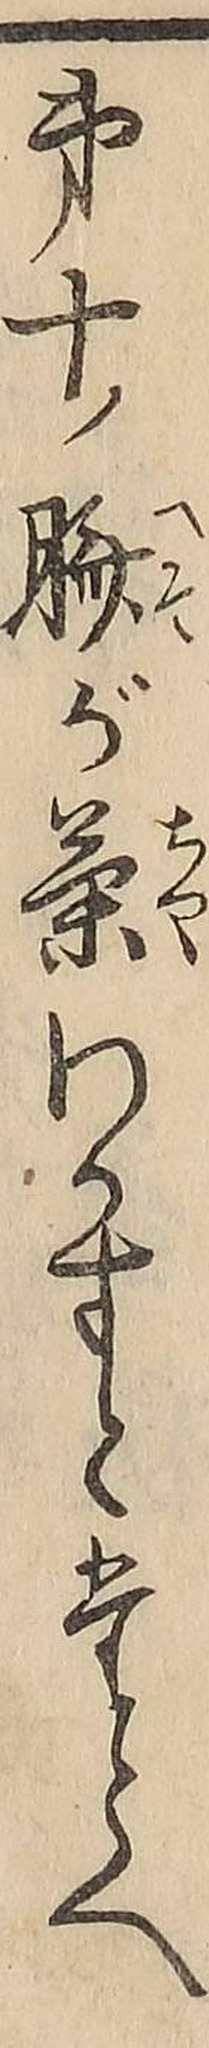第十の臍が茶わかすとたとへ。

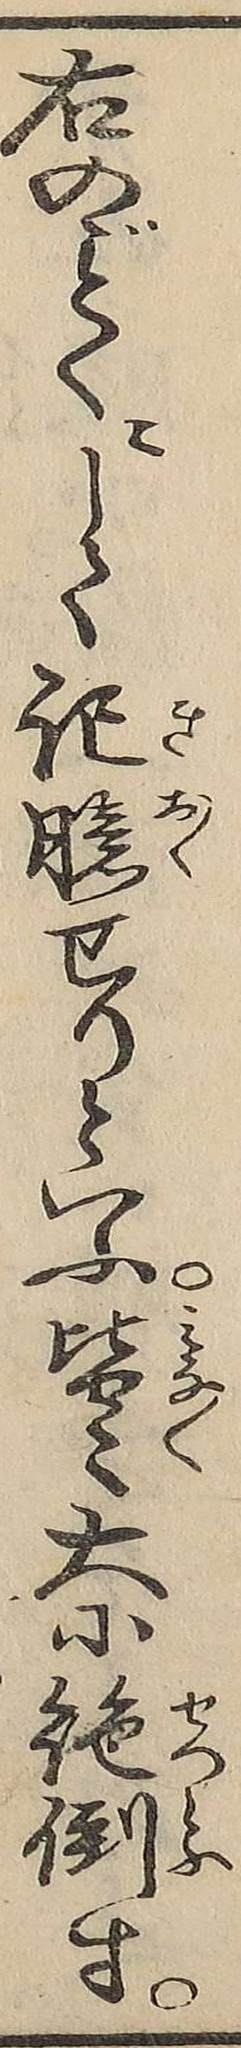右のごとくにして記臆せりといふ。皆々大に絶倒す。
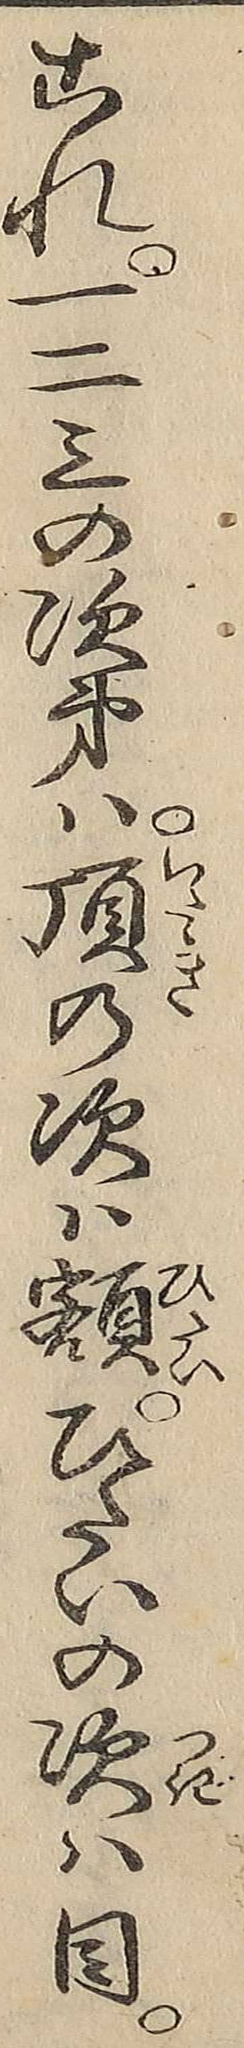これ。一二三の次第は。頂の次は額。ひたいの次は目。
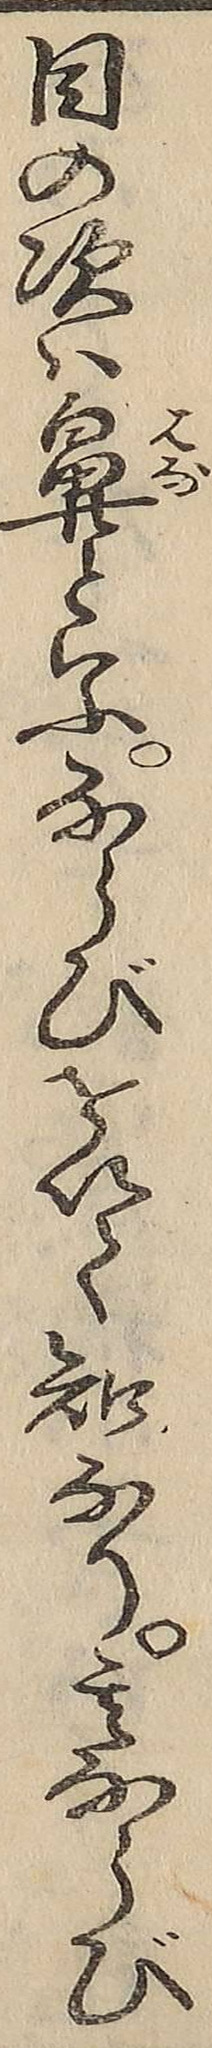目の次は鼻といふ。ならびを以て知なり。其ならび
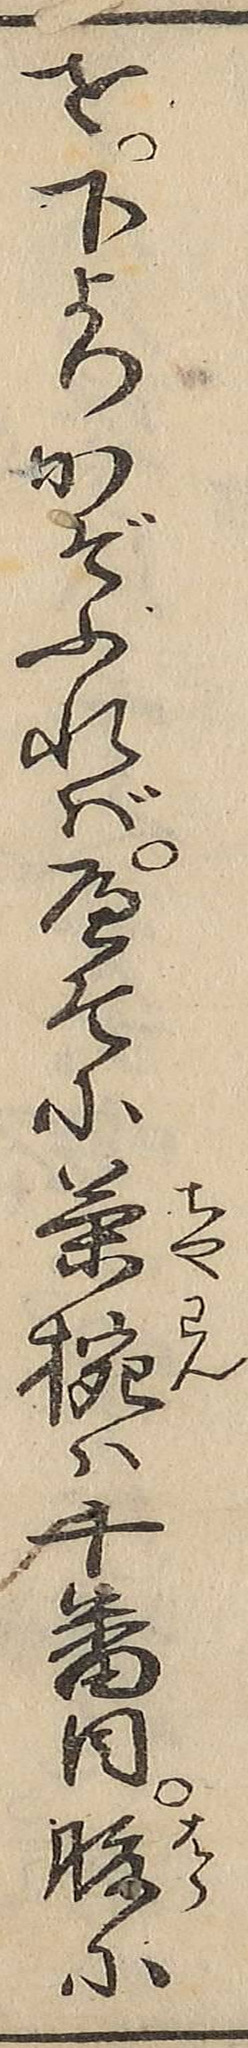を。下よりかぞふれば。へそに茶椀は十番目。腹に
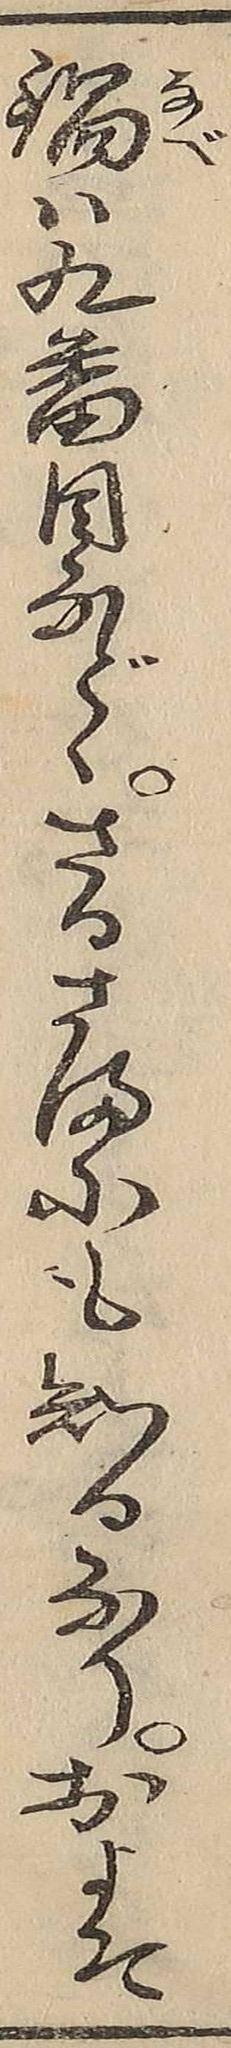鍋は九番目などゝ。さるさまにも知るなり。およそ
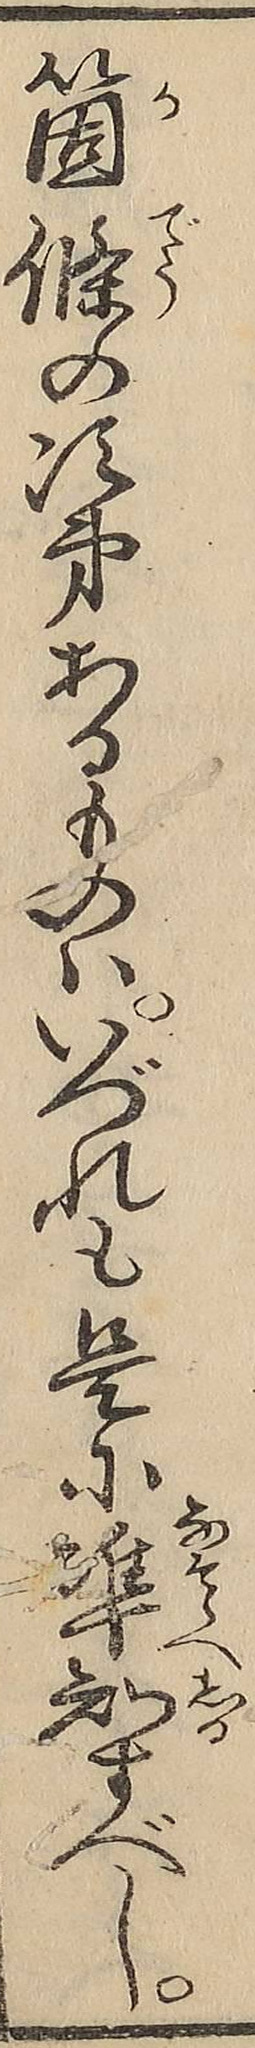箇条の次第あるものは。いづれも是に準知すべし。
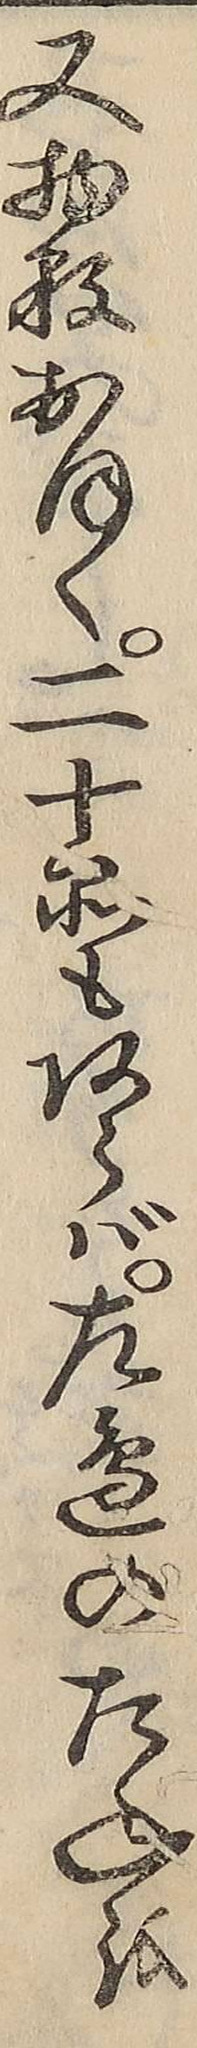又物数おほく。二十品もあらば。左辺のたねを
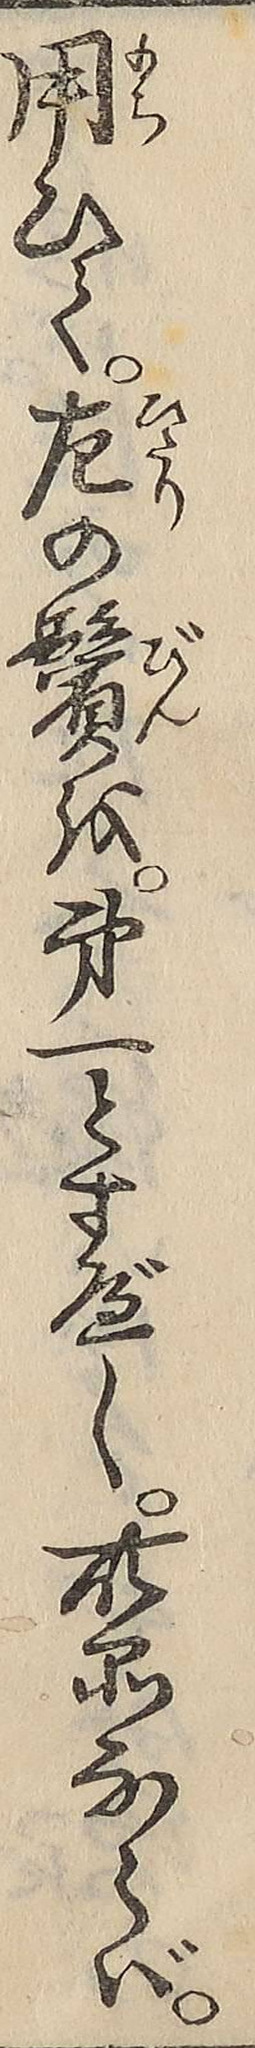用ひて。左の鬢を。第一とすべし。卅品ならば。
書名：物覺秘傳
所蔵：神戸大学附属図書館 国文学研究資料館
